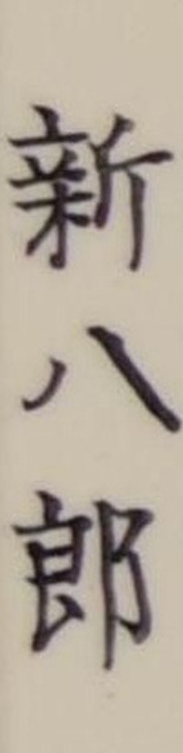新八郎

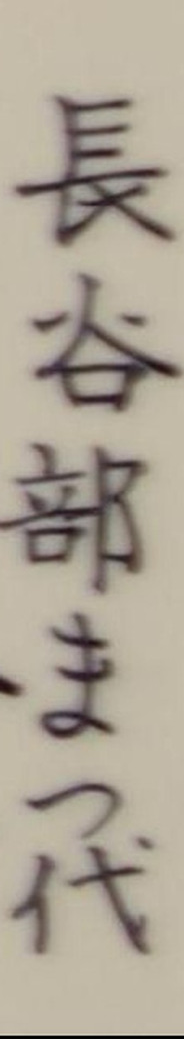長谷部まつ代
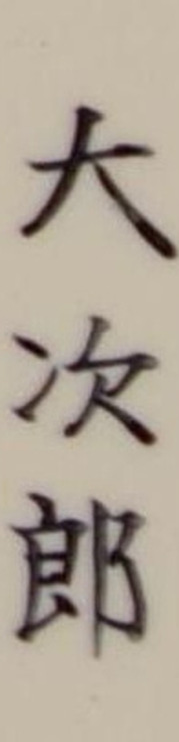大次郎
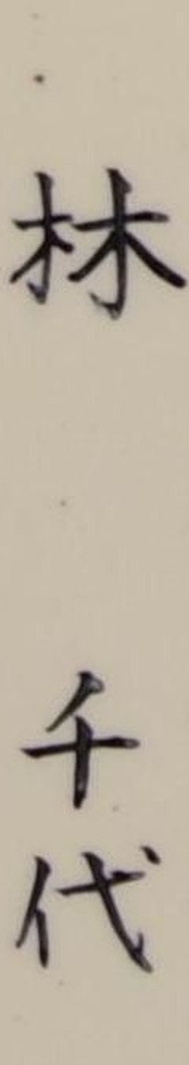林千代
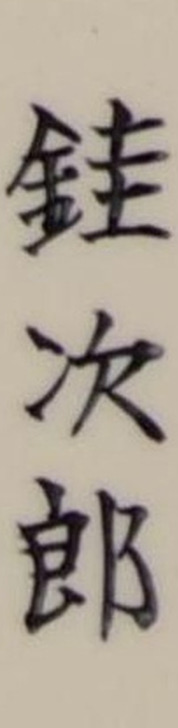大次郎

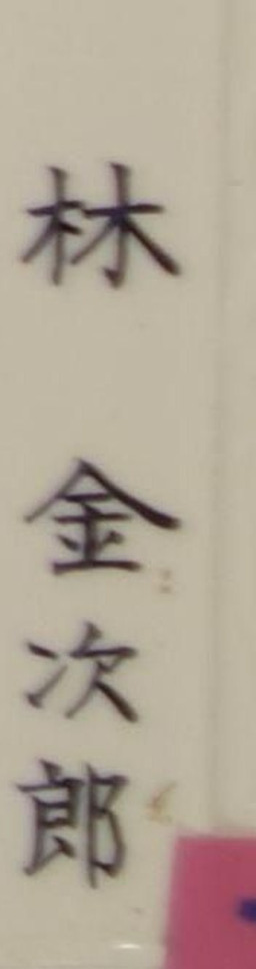林金次郎
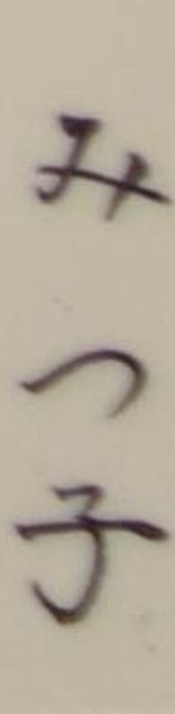みつ子
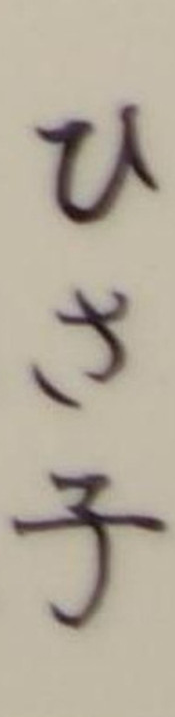ひさ子
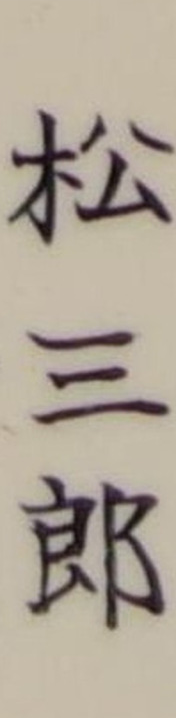松三郎
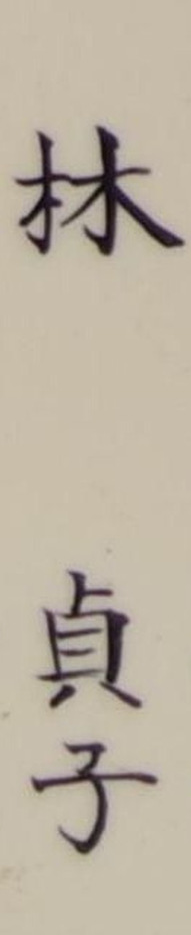林貞子

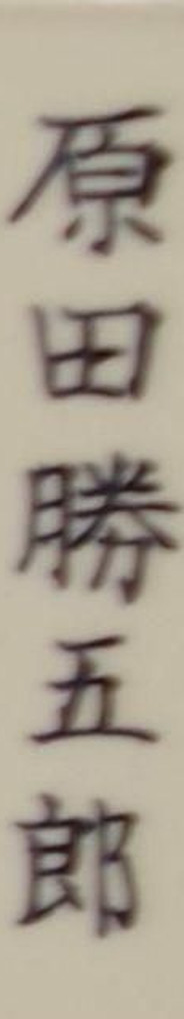原田勝五郎
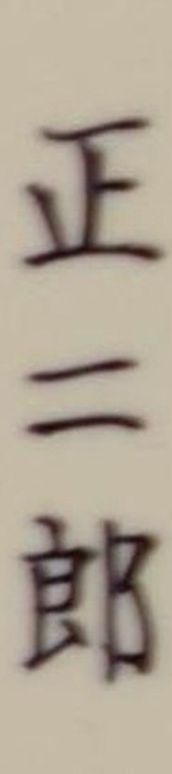正二郎
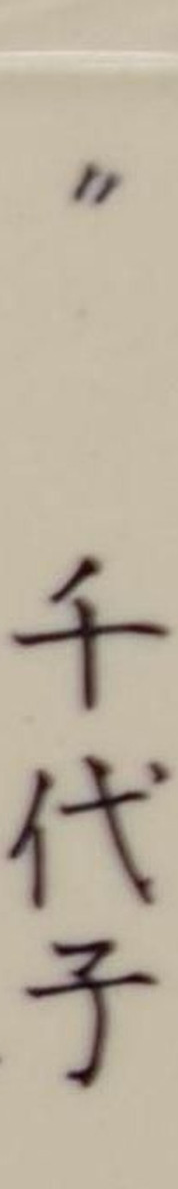千代子
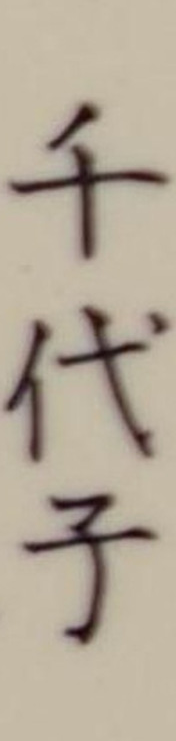千代子
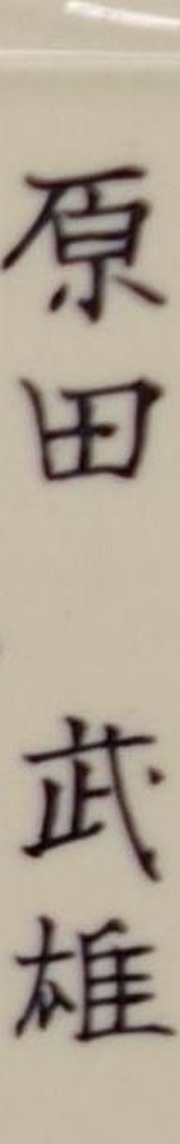原田武雄
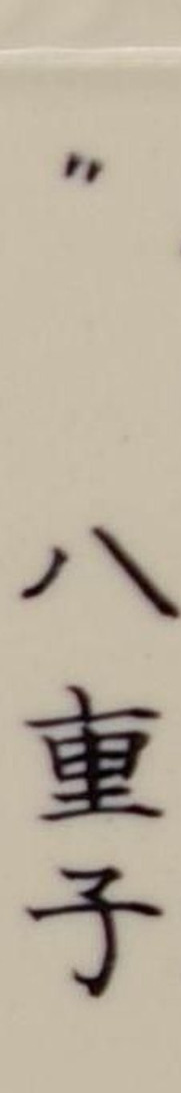八重子
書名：M~S
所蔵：高野山金剛峯寺
